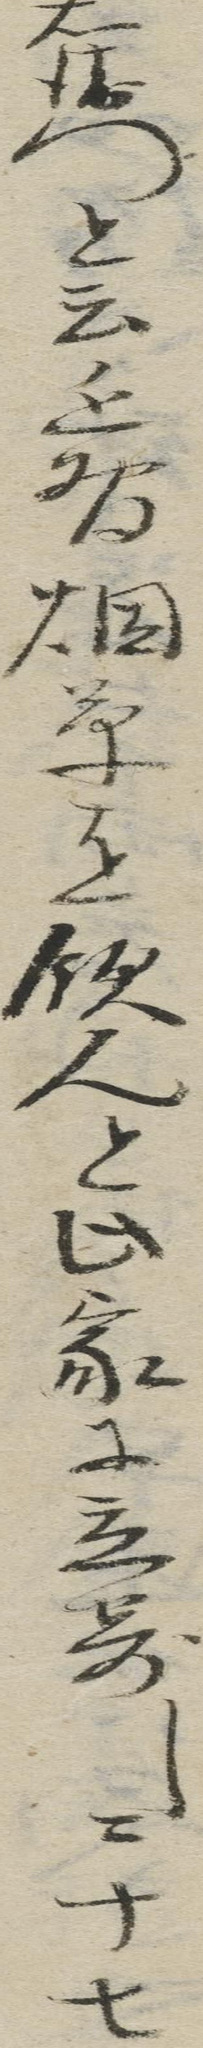右衛門と云近習煙草を飲んと此家に立寄しニ十七
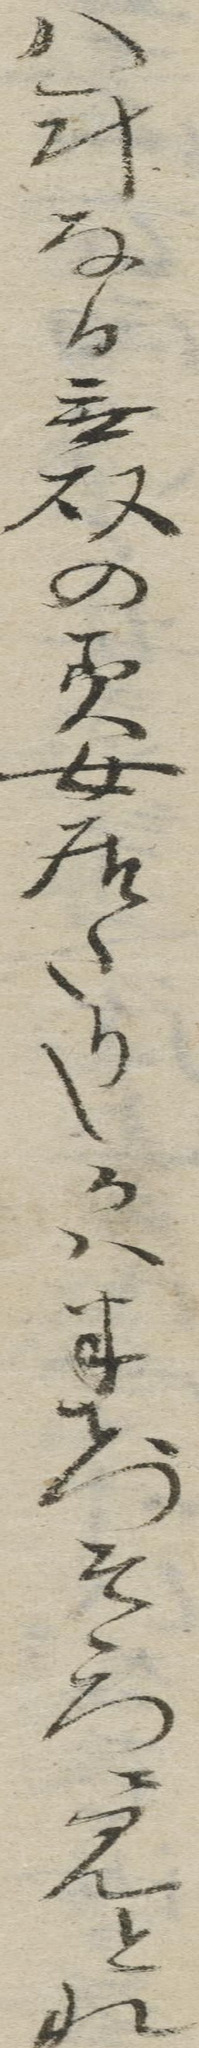八計なる無双の美女居たりしかハ半右衛門そゝろニ見とれ
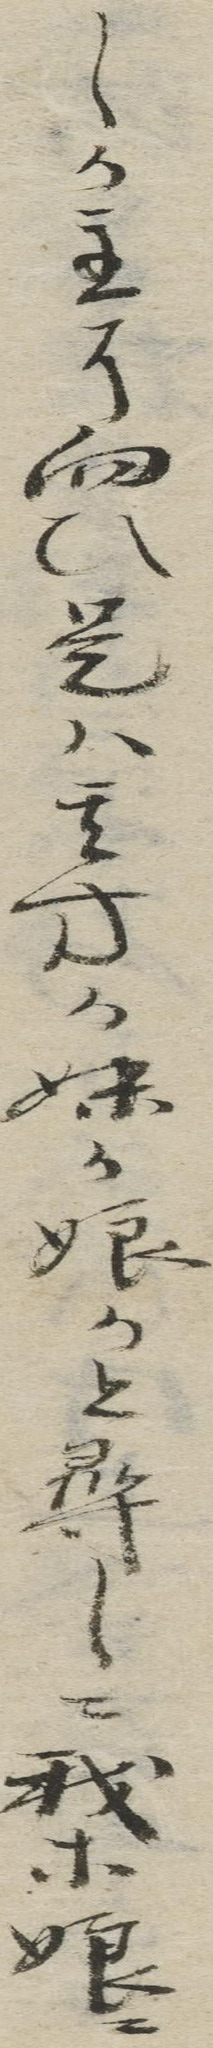しか主に向ひ是は其方か妹か娘かと尋しニ我等娘ニ
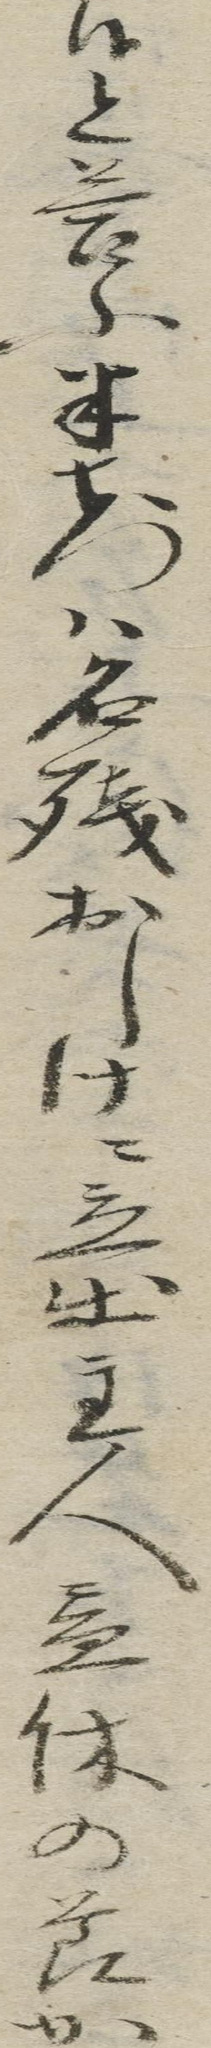候と答ふ半右衛門ハ名残おしけニ立出主人昼休の節か
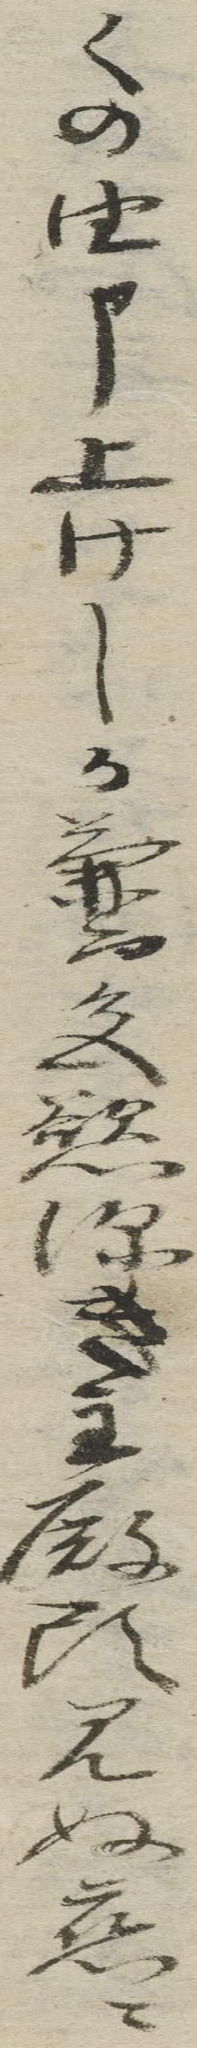くの由申上けしか兼而色欲深き主殿頭見ぬ恋ニ
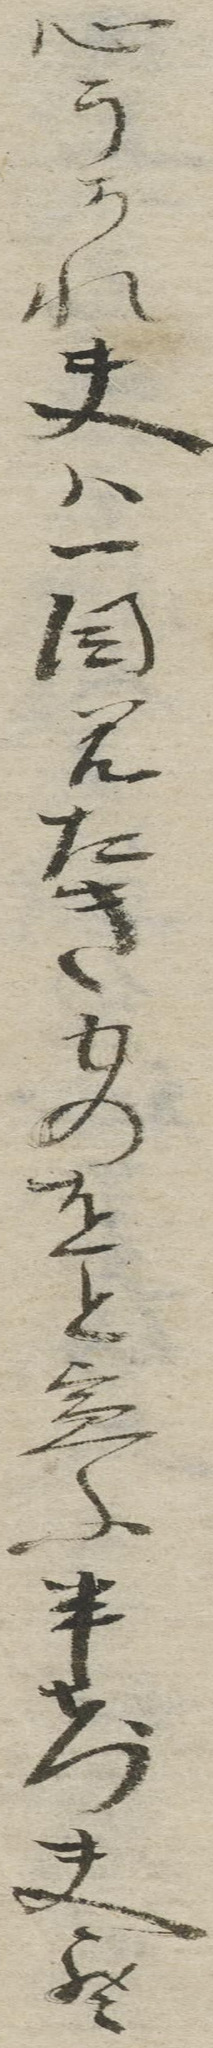心うかれ夫ハ一目見たきものをと宣ふ半右衛門夫は
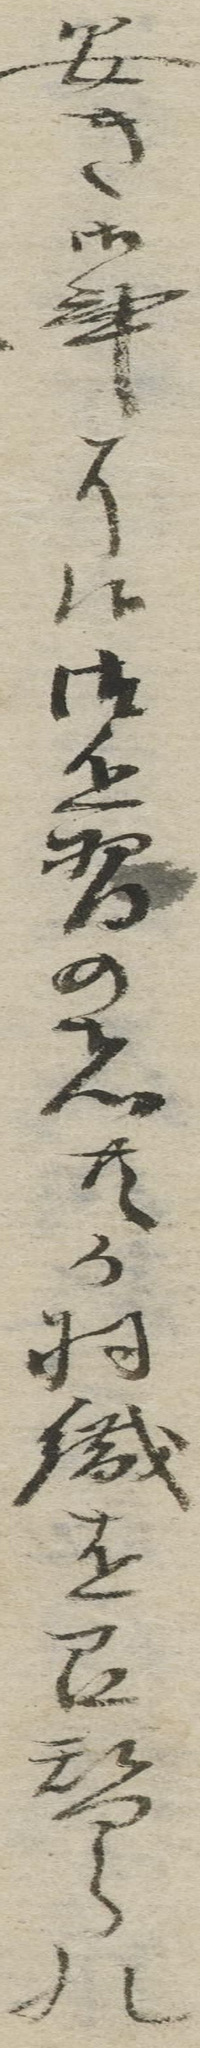安き御事に候御近習の者共か羽織を召替られ
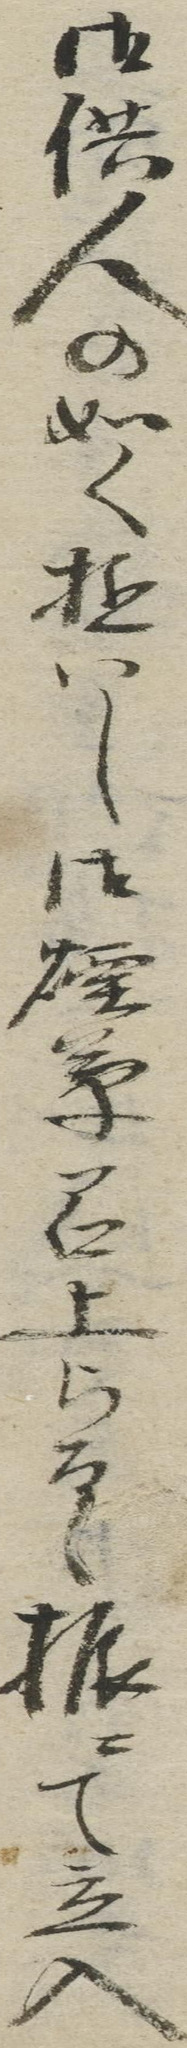御供人の如く遊ハし御煙草召上らるゝ振ニて立入
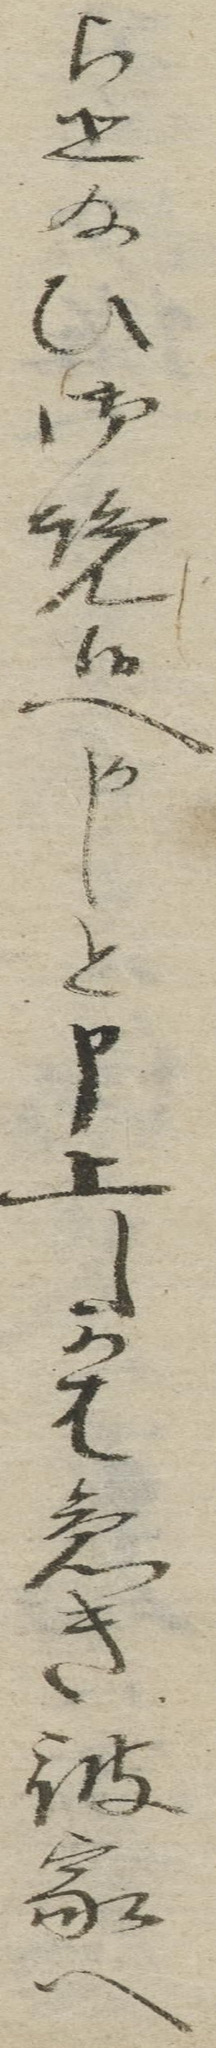らせ給ひ御覧候へかしと申上しかは急き彼家へ
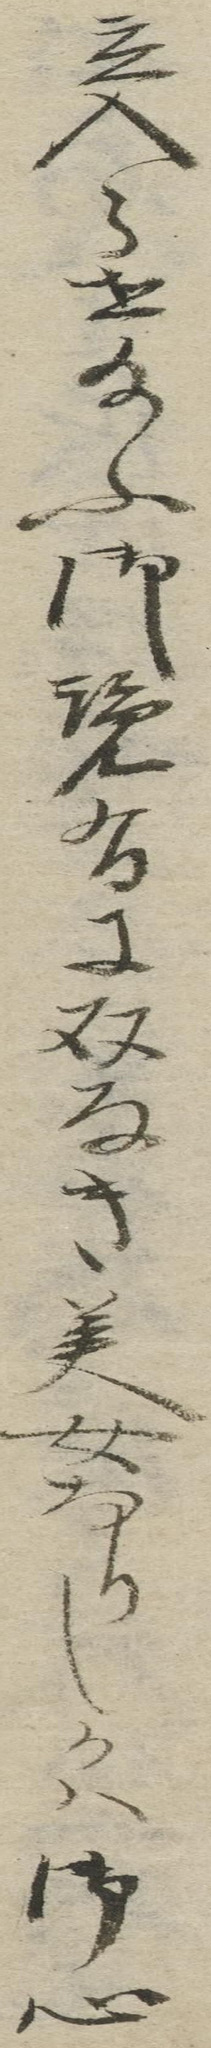立入らせ給ふ御覧有に双なき美女なりしかハ御心

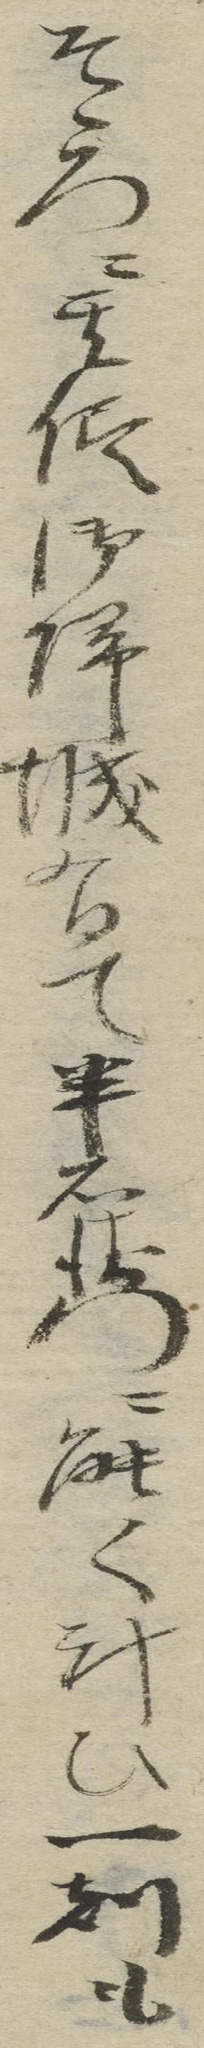そゝろニ其侭御帰城有て半右衛門ニ能く計ひ一刻も
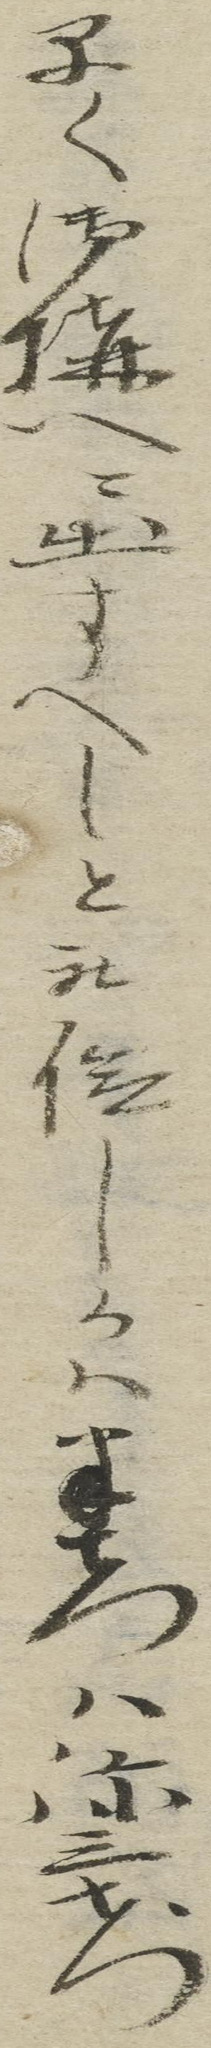早く御構ヘニ出すへしと被仰しかハ半右衛門は弥三右衛門
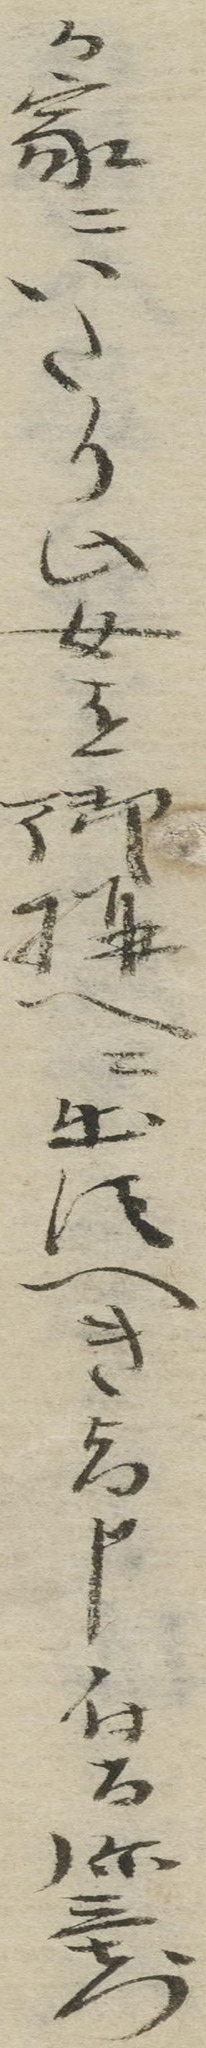か家ニいたり此女を御構へニ出すへき旨申付て弥三右衛門
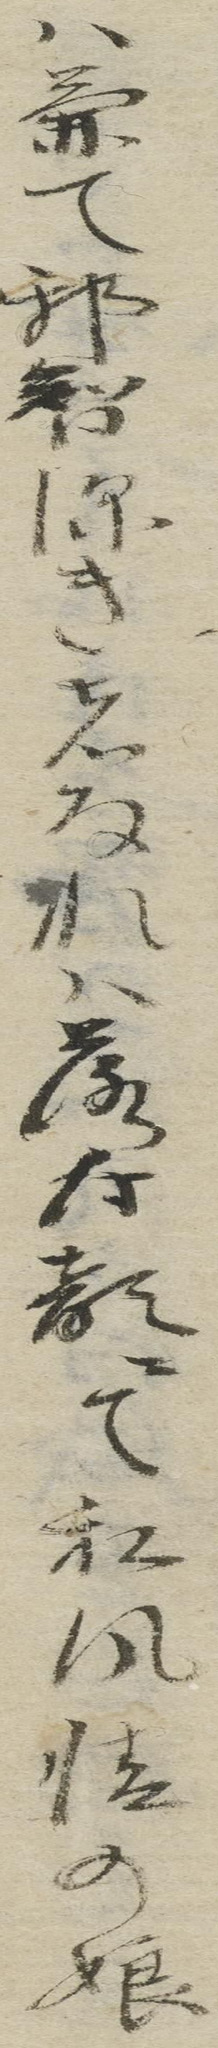ハ兼て邪智深き者なれハ落付顔にて私風情の娘
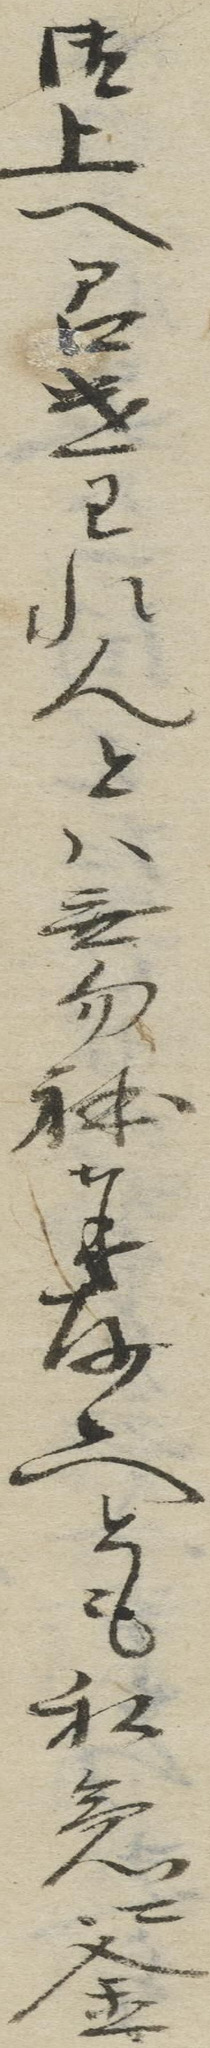御上へ召遣われんとハ無勿躰奉存候へとも私急ニ金
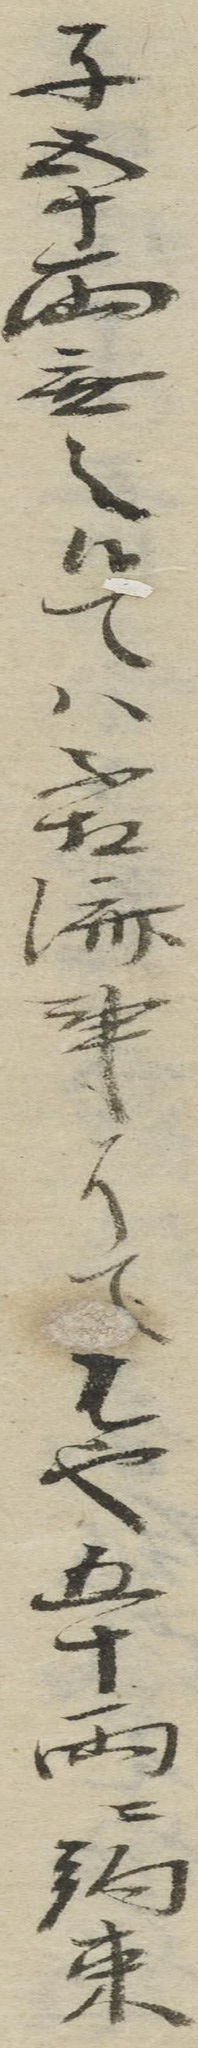子五十両無之候てハ不相済事にてはや五十両ニ約束
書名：肥前國島原領普賢山大変記　完
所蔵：東京大学地震研究所図書室 Earthquake Research Institute Library, The University of Tokyo, JAPAN
